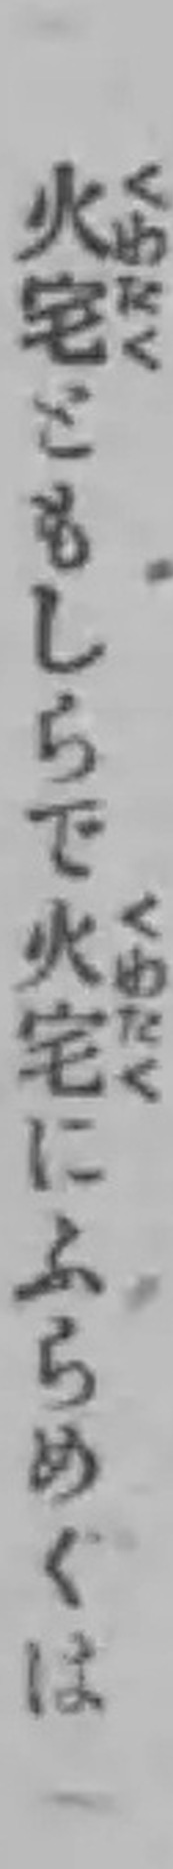火宅ともしらで火宅にふらめくは
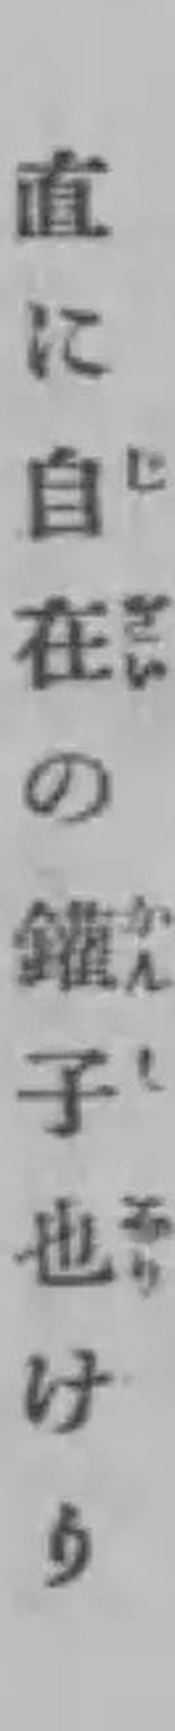直に自在の鑵子也けり
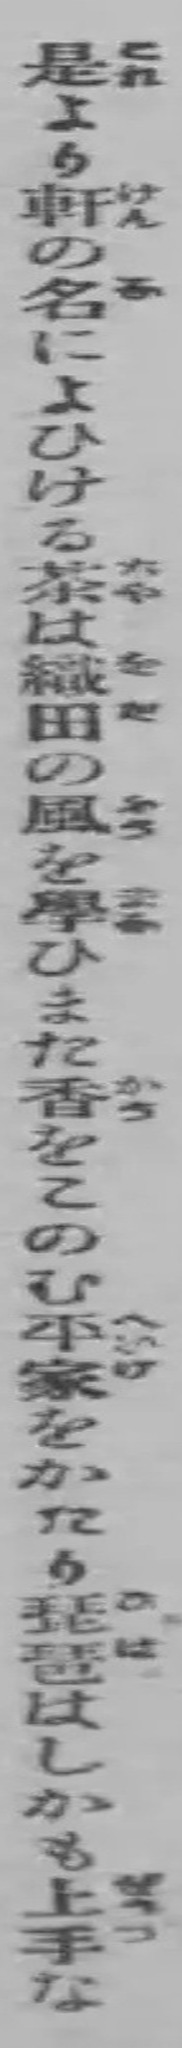是より軒の名によひける茶は織田の風を学ひまた香をこのむ平家をかたり琵琶はしかも上手な
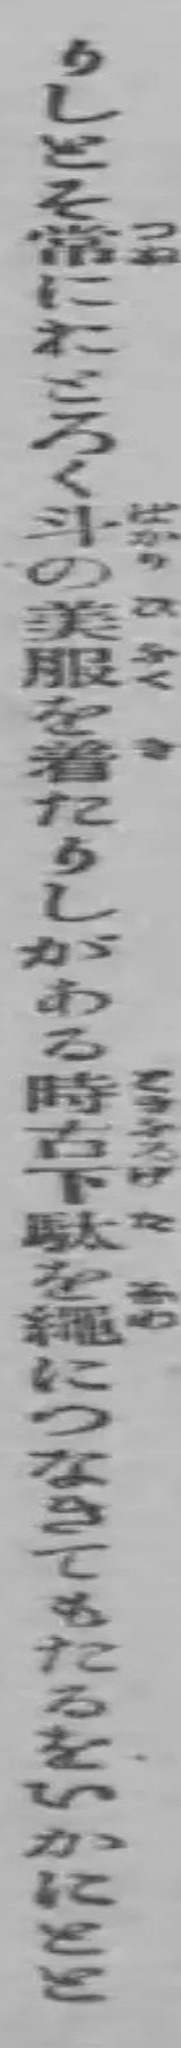りしとそ常におとろく斗の美服を着たりしがある時古下駄を縄につなきてもたるをいかにとと
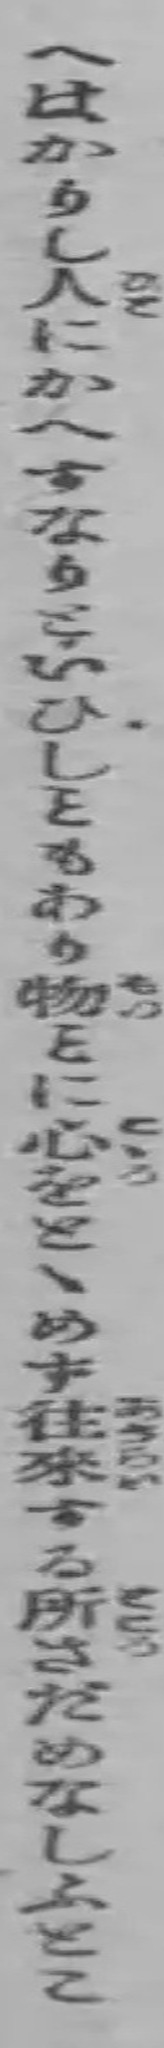へはかりし人にかへすなりといひしこともあり物ことに心をとゝめず往来する所さだめなしふとこ

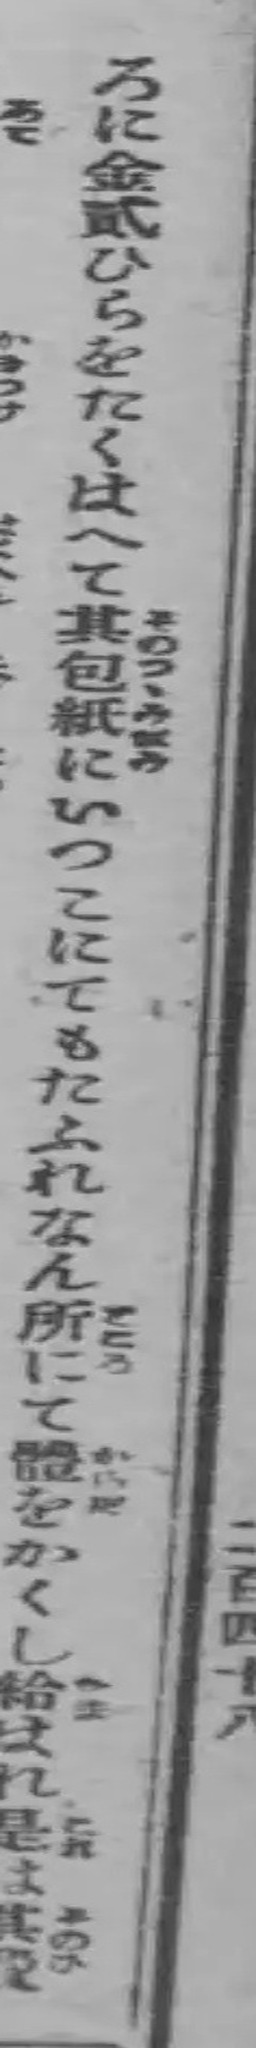ろに金弐ひらをたくはへて其包紙にいつこにてもたふれなん所にて體をかくし給はれ是は其費
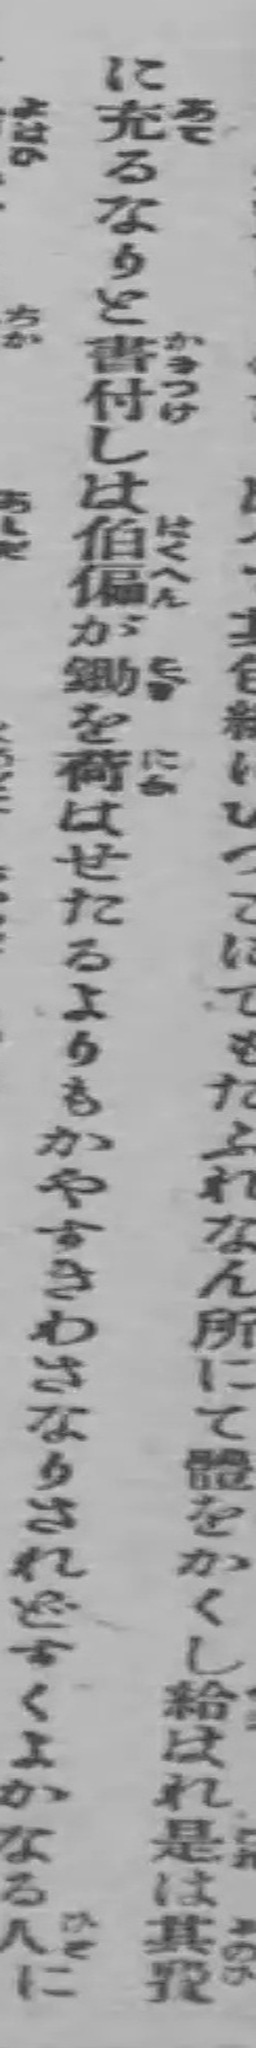に充るなりと書付しは伯偏が鋤を荷はせたるよりもかやすきわさなりされどすくよかなる人に
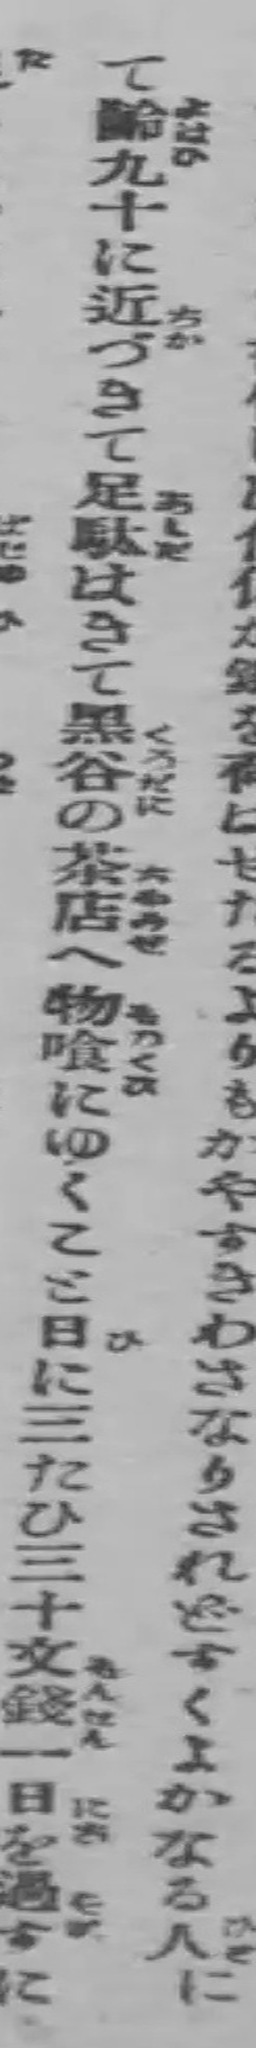て齢九十に近づきて足駄はきて黒谷の茶店へ物喰にゆくこと日に三たひ三十文銭一日を過すに
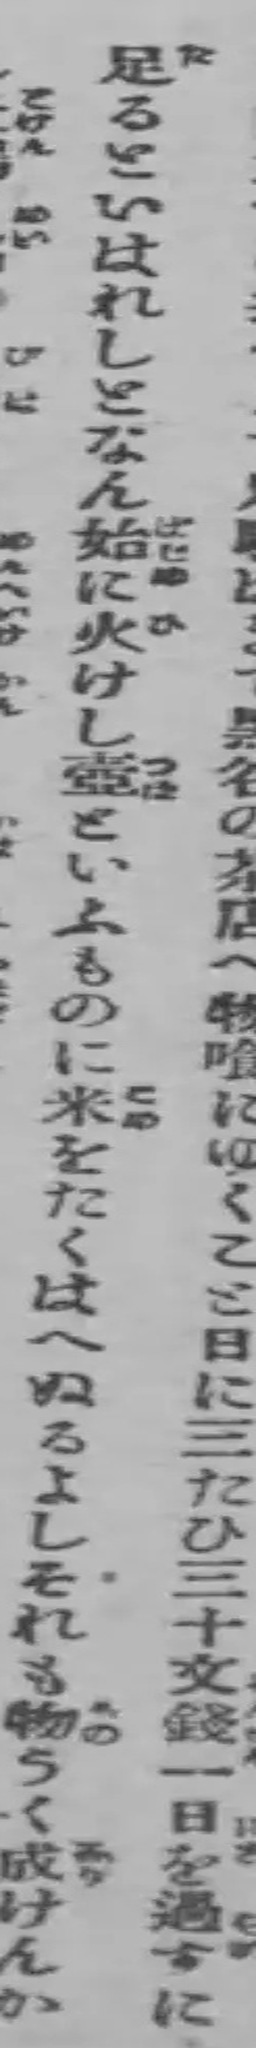足るといはれしとなん始に火けし壺といふものに米をたくはへぬるよしそれも物うく成けんか
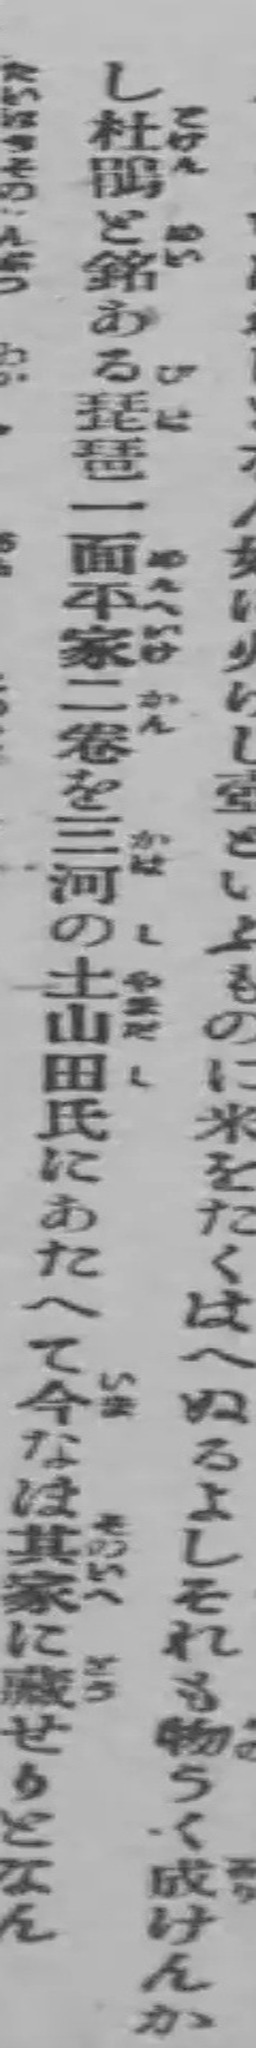し杜鵑と銘ある琵琶一面平家二巻を三河の士山田氏にあたへて今なほ其家に蔵せりとなん
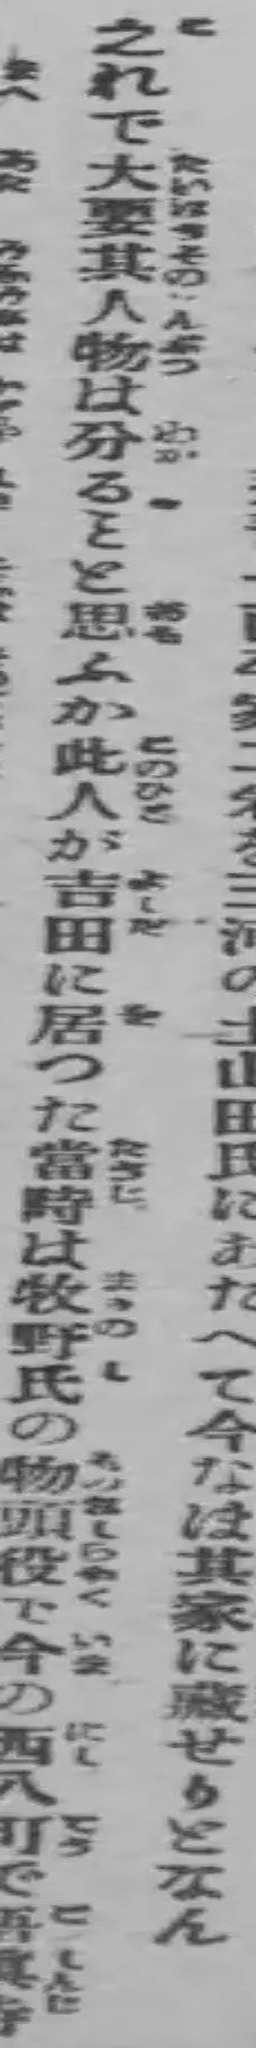之れで大要其人物は分ることと思ふか此人が吉田に居つた当時は牧野氏の頭役物で今の西八町で悟眞寺
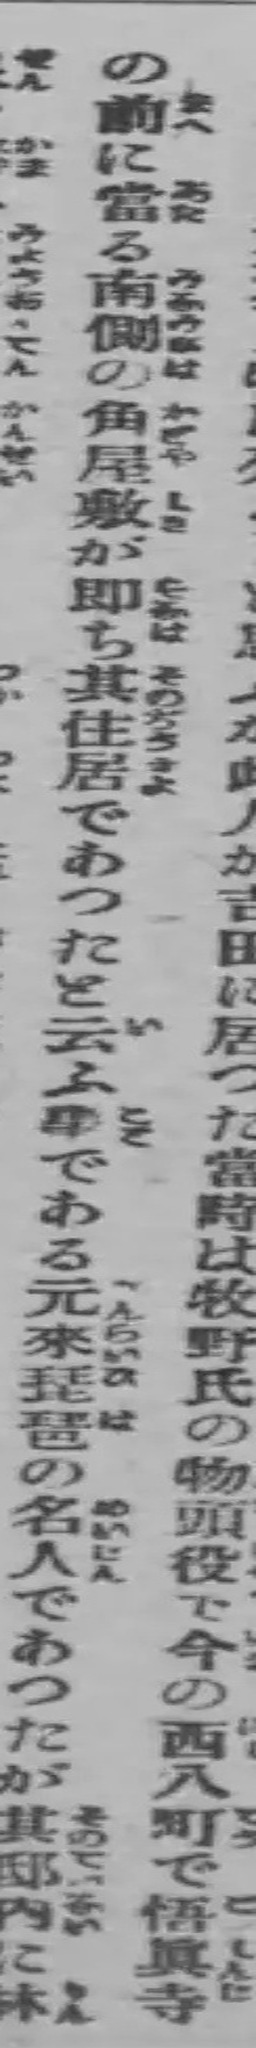の前に当る南側の角屋敷が即ち其住居であつたと云ふ事である元来琵琶の名人であつたが其邸内に林
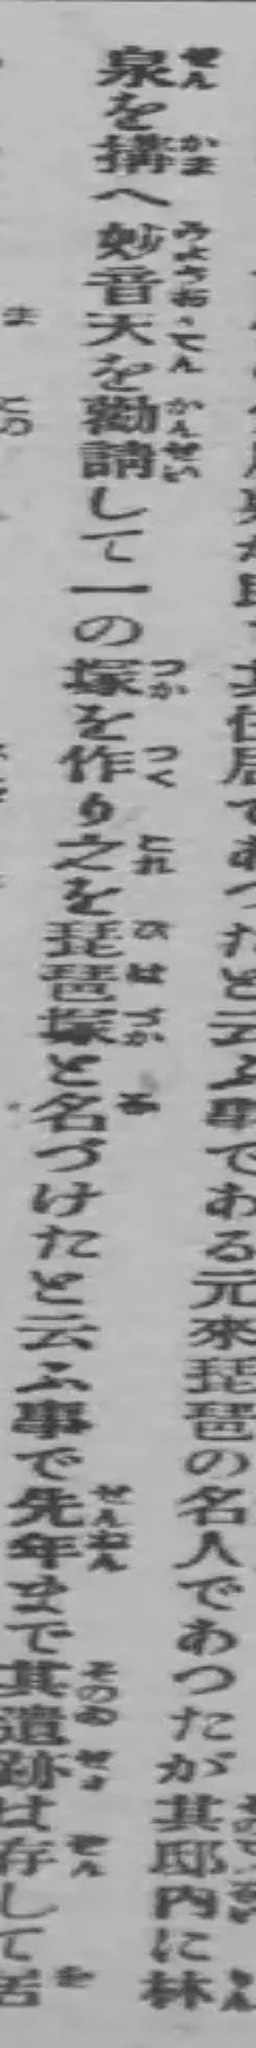泉を構へ妙音天を勧請して一の塚を作り之を琵琶塚と名づけたと云ふ事で先年まで其遺跡は存して居
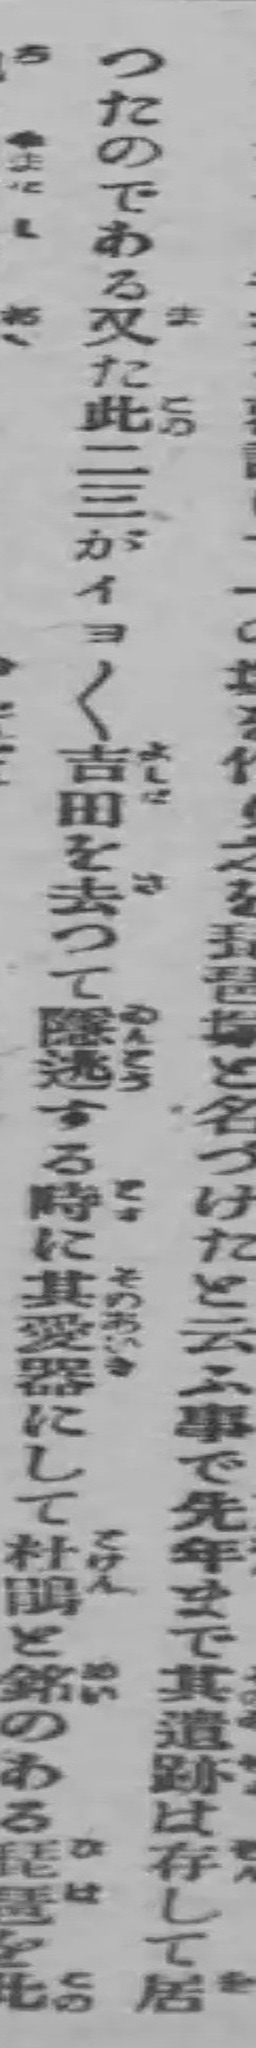つたのである又た此二三がイヨ〳〵吉田を去つて隠逃する時に其愛器にして吐鵑と銘のある琵琶を此
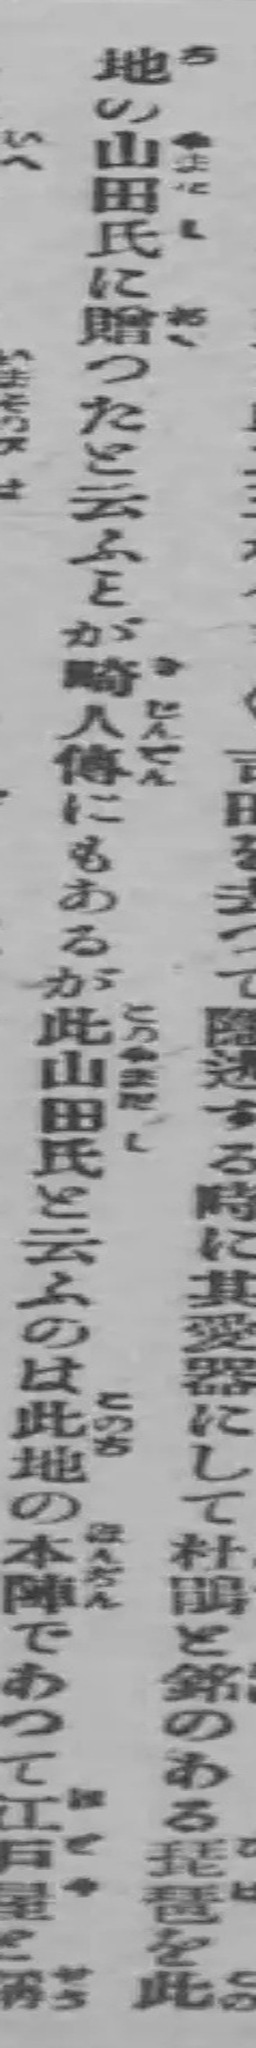地の山田氏に贈つたと云ふことが畸人伝にもあるが此山田氏と云ふのは此地の本陣であつた江戸屋と称
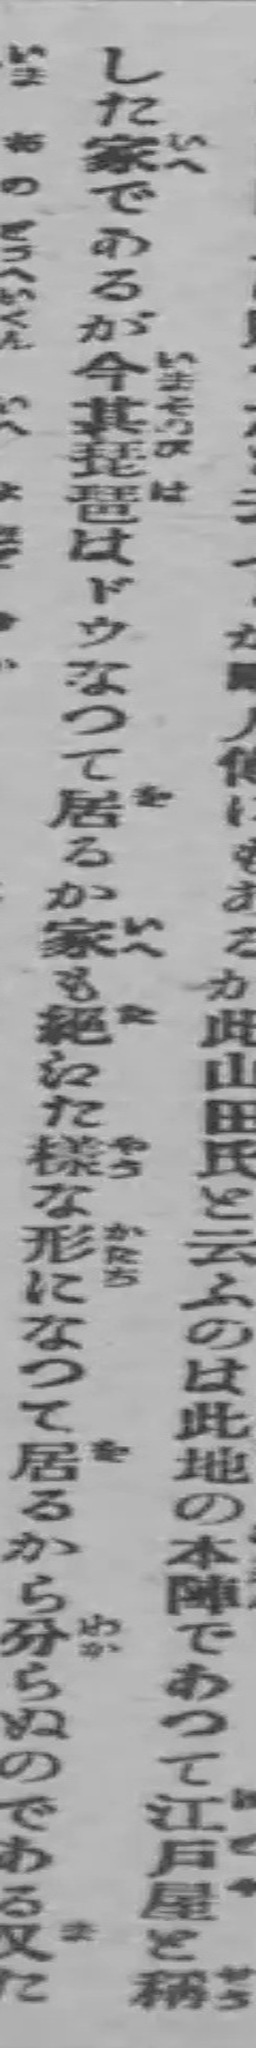した家であるが今其琵琶はドウなつて居るか家も絶えた様な形になつて居るから分らぬのである又た
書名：豊橋市史談
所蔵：国立国会図書館 National Diet Library, JAPAN
